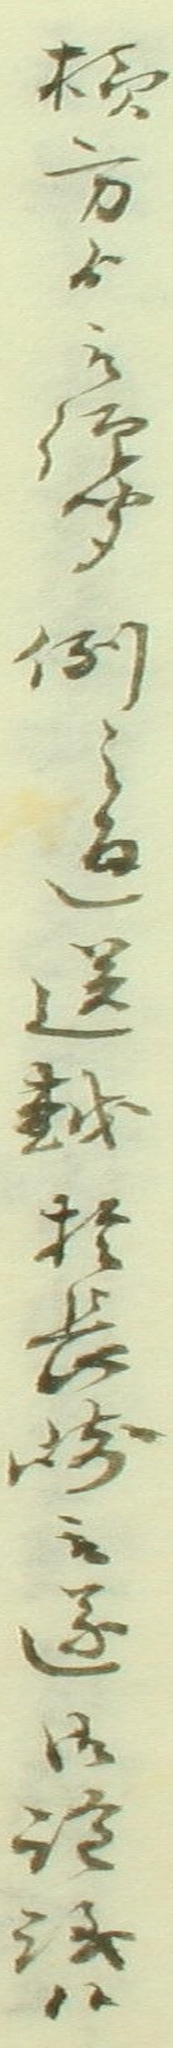様方ゟ被仰聞例之通送越於長崎被遂御詮議候
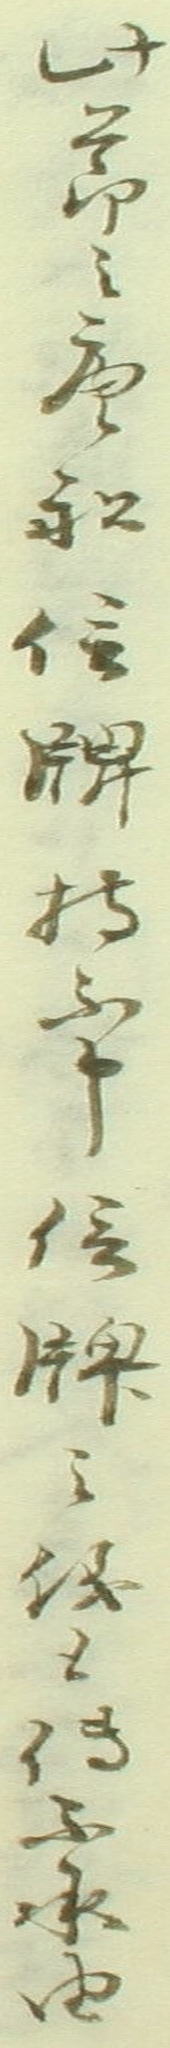此節之唐船信牌持不申信牌之儀も伝不承由
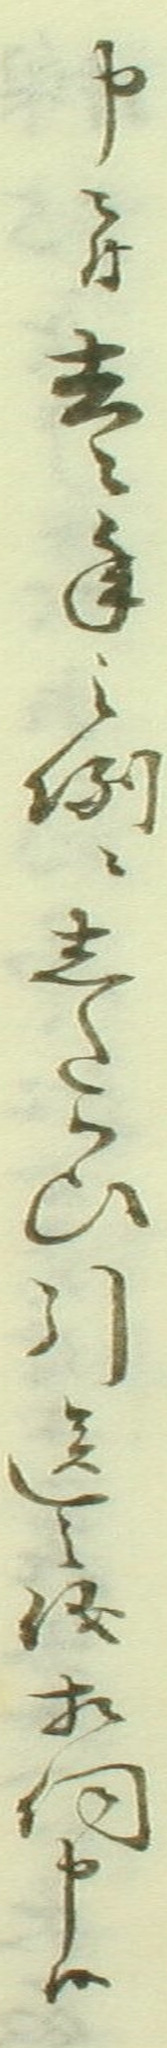申に付去々年之例にしたかひ引送之儀相伺申候
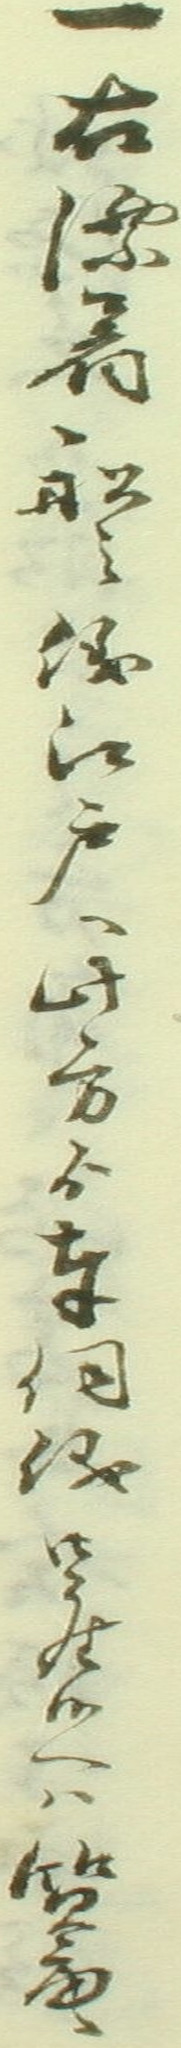一右漂着船之儀江戸へ此方ゟ奉伺儀御座候へは質唐
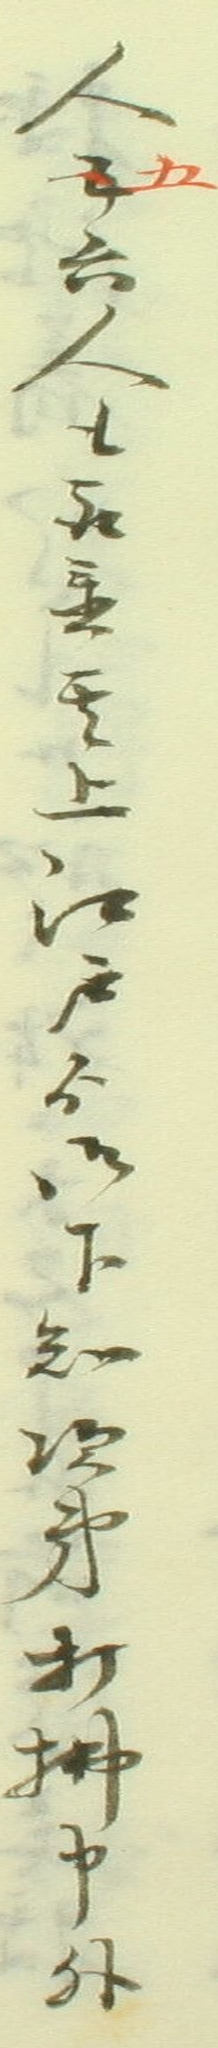人六人も取置其上江戸ゟ御下知次第打払申外
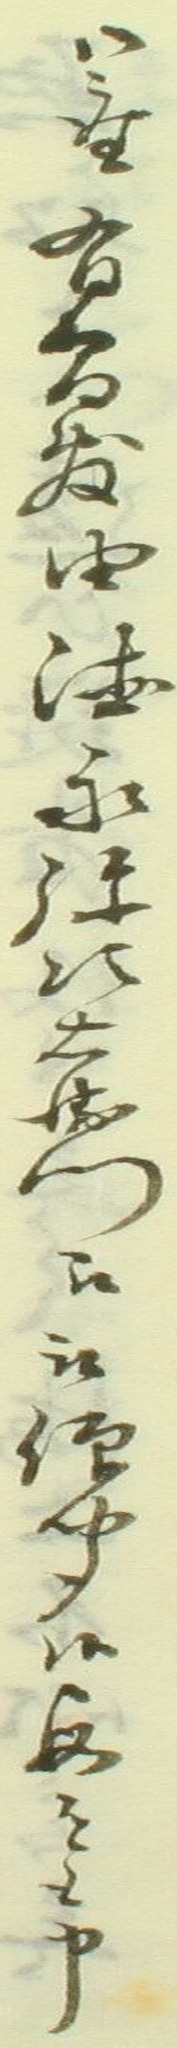御座有間敷由徳永弥次右衛門え被仰聞候段をも申
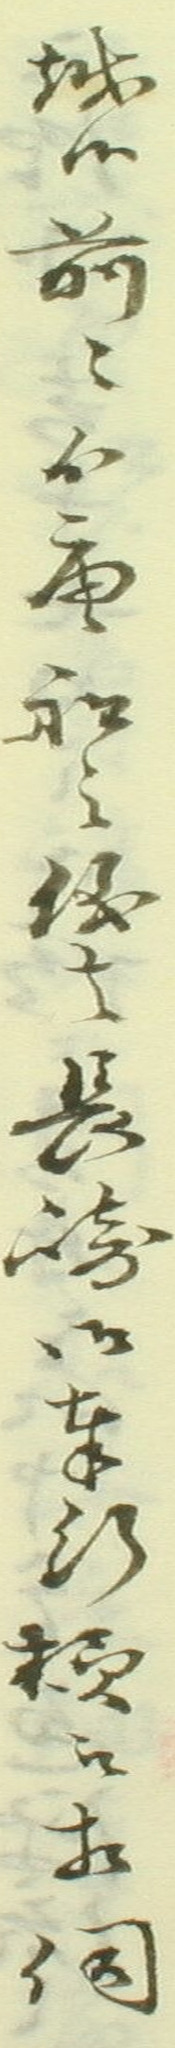越候前々ゟ唐船之儀は長崎御奉行様え相伺
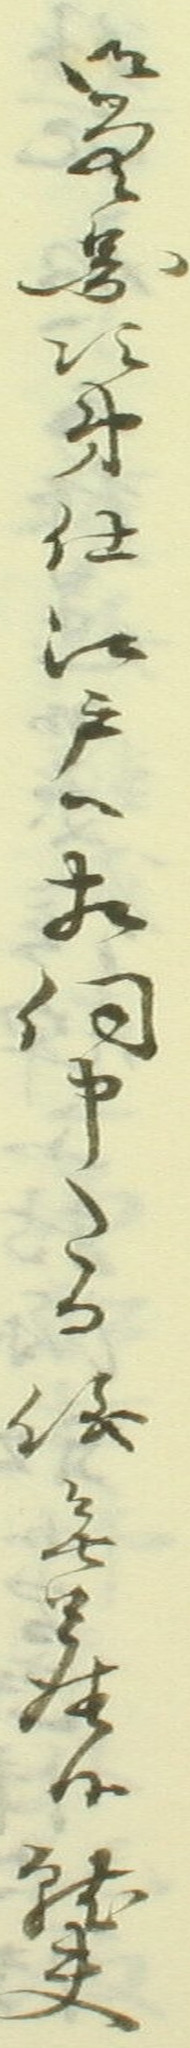御差図次第仕江戸へ相伺申たる儀無御座候就夫
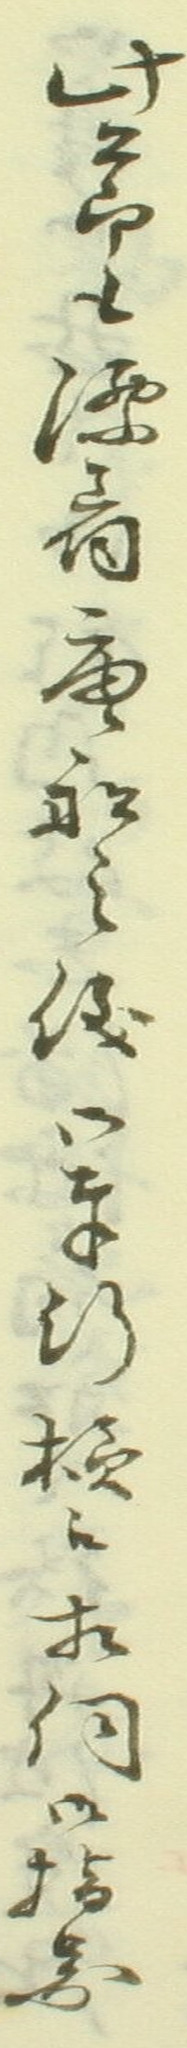此節も漂着唐船之儀御奉行様え相伺御指図
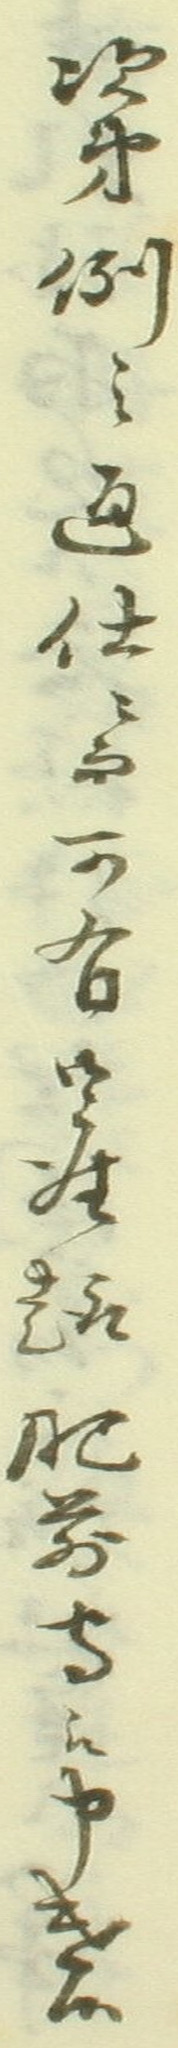次第例之通仕に而可有御座趣肥前守え申遣候
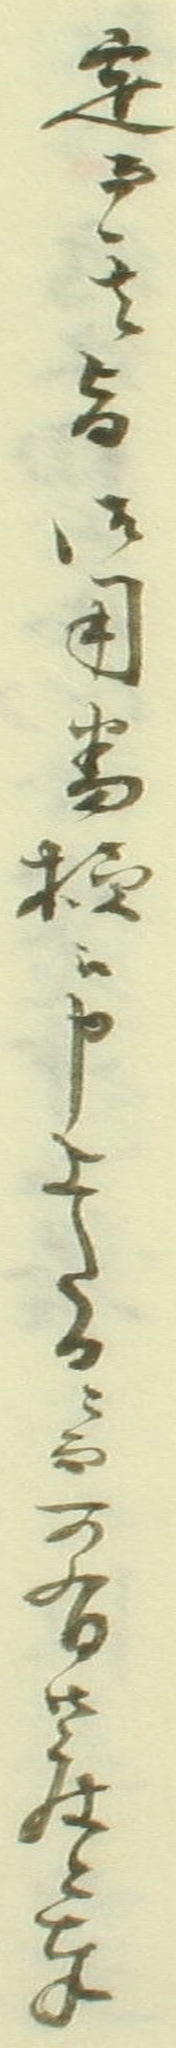定而其旨御用番様え申上たるに而可有御座と奉
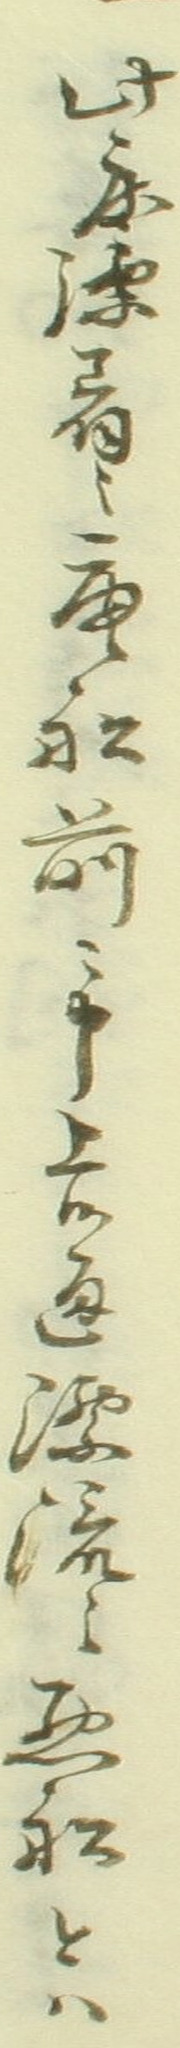一此度漂着之唐船前々申上候通漂流之悪船とは
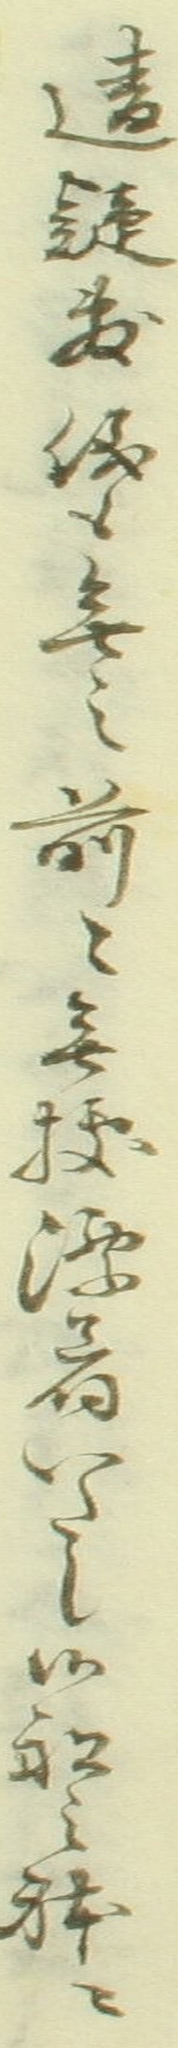違疑敷儀も無之前々無拠漂着いたし候船之躰に
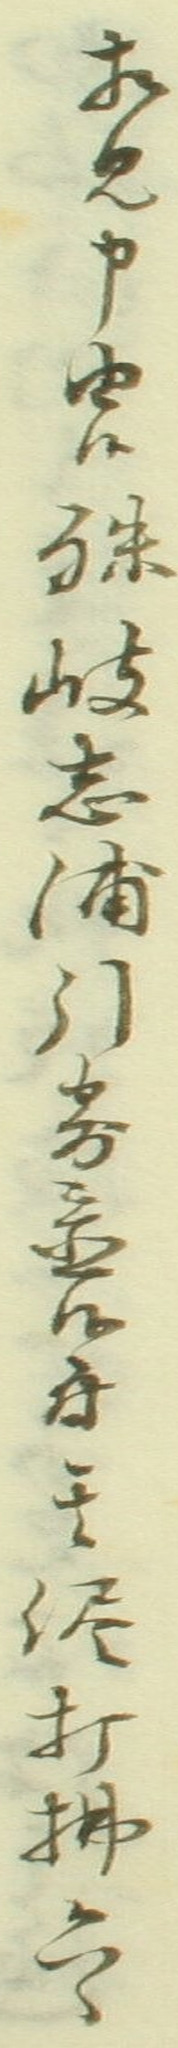相見申由候殊岐志浦引寄置候に付其侭打払候はゝ
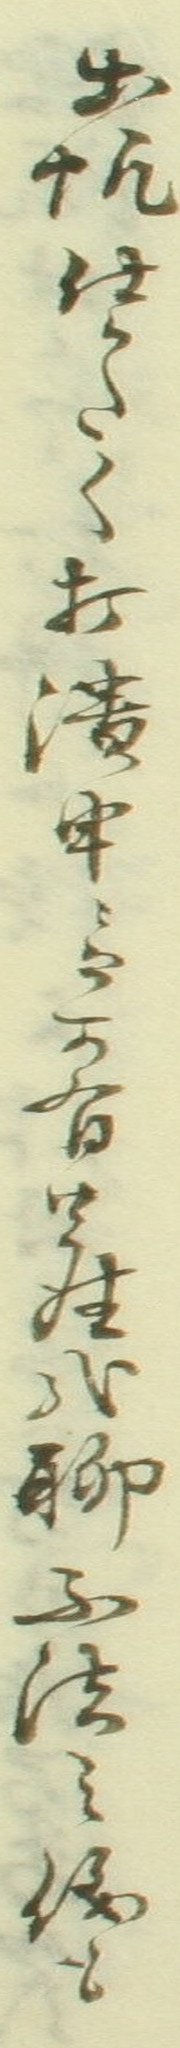出帆仕かた〳〵打潰申に而可有御座哉聊不法之儀も
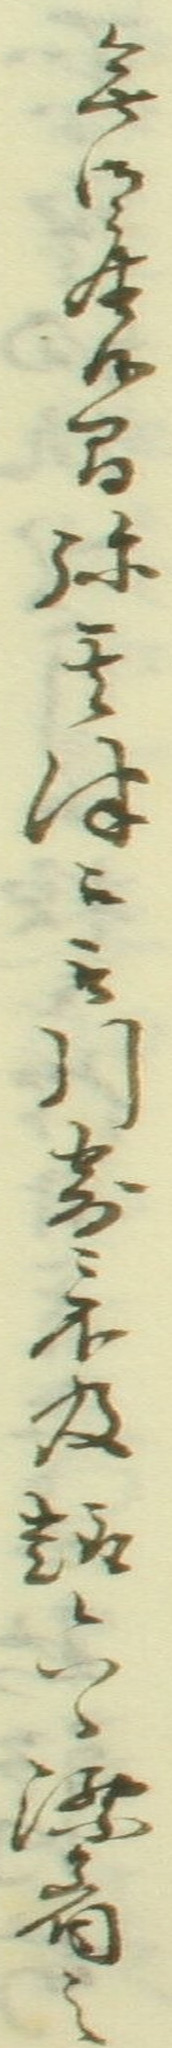無御座候間弥其津え被引寄に不及趣候はゝ漂着之
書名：異国船漂着記
